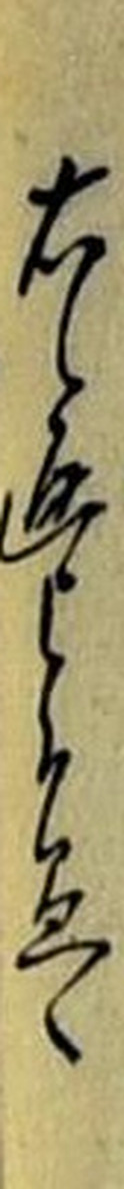右之通被下置候
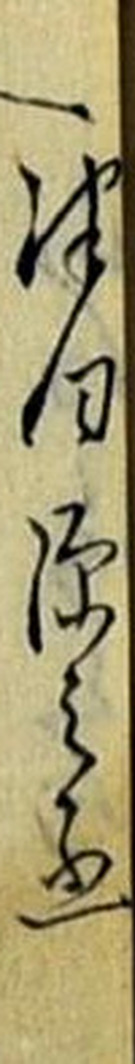津田源之丞
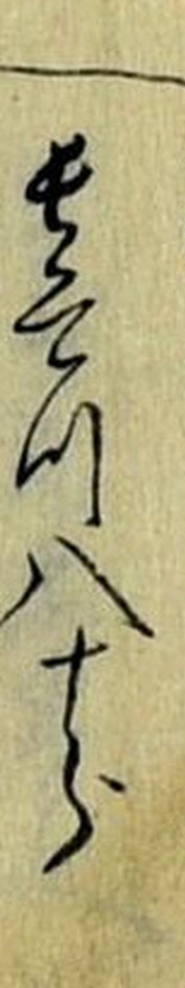長谷川八十郎
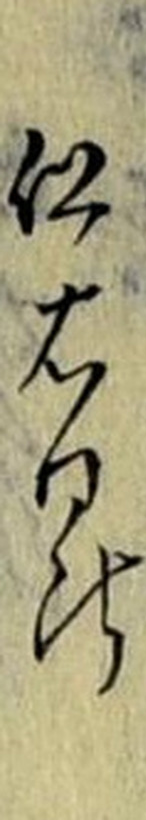但右同断
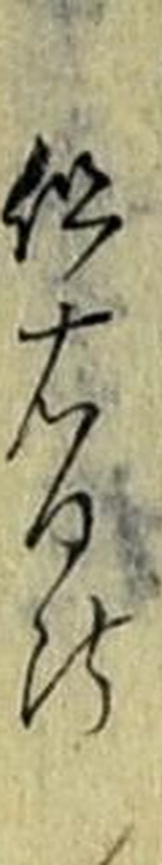但右同断
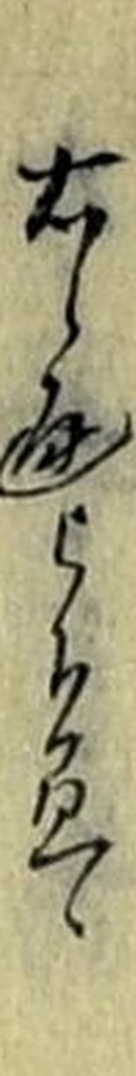右之通被下置候
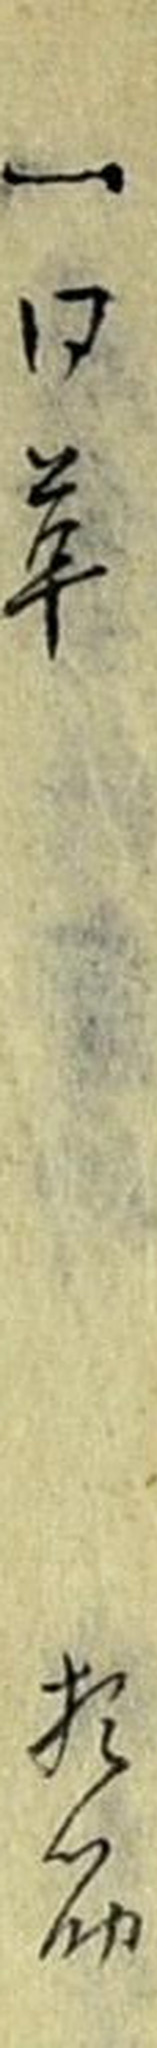一同革拾筋
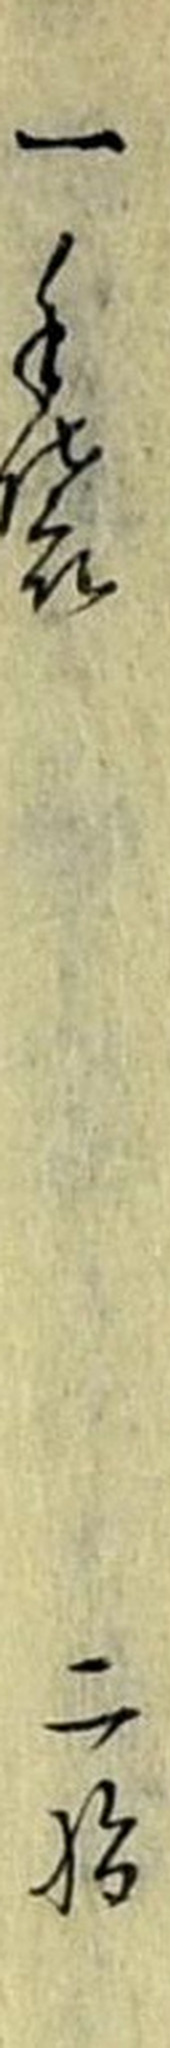一手袋二指
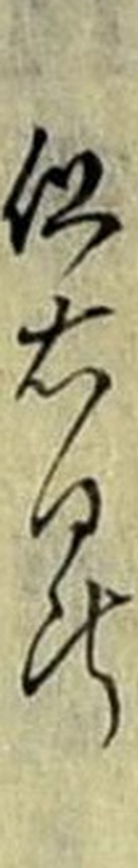但右同断
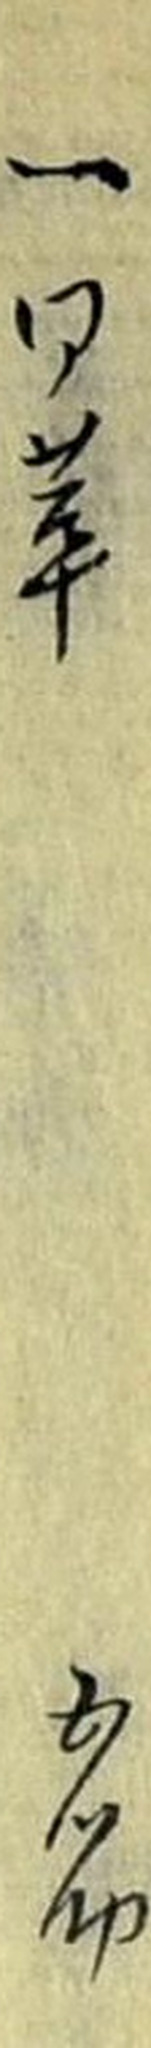一同革拾筋
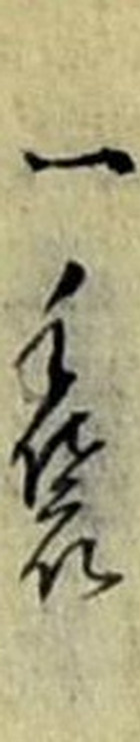一手袋二指
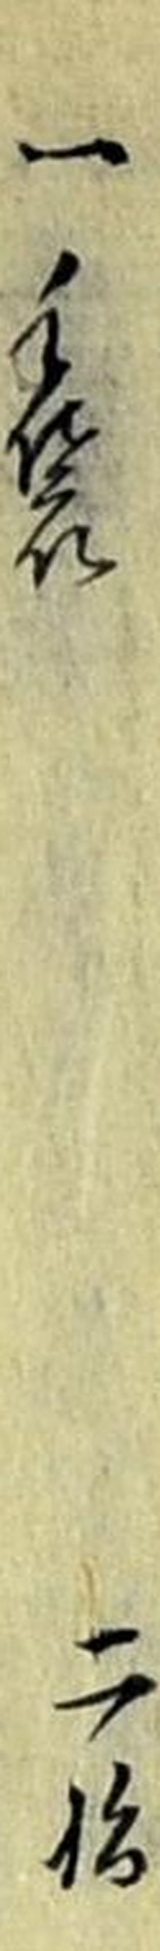一手袋二指
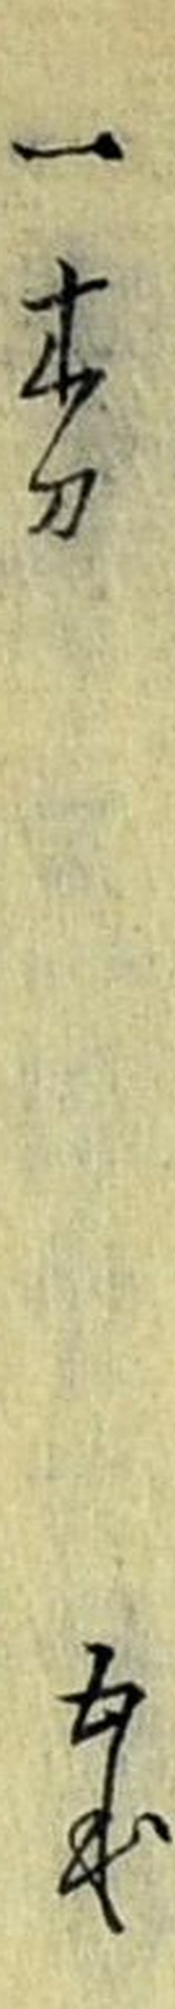一木刀五本
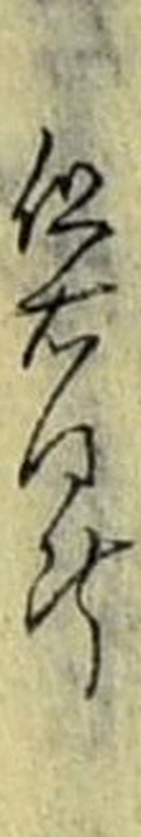但右同断

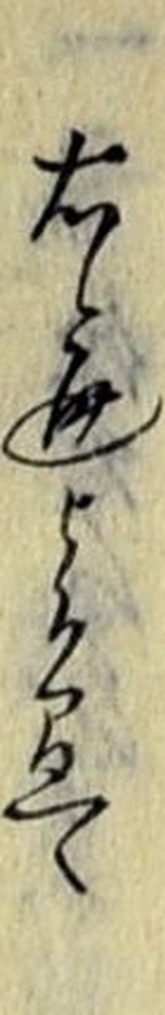右之通被下置候
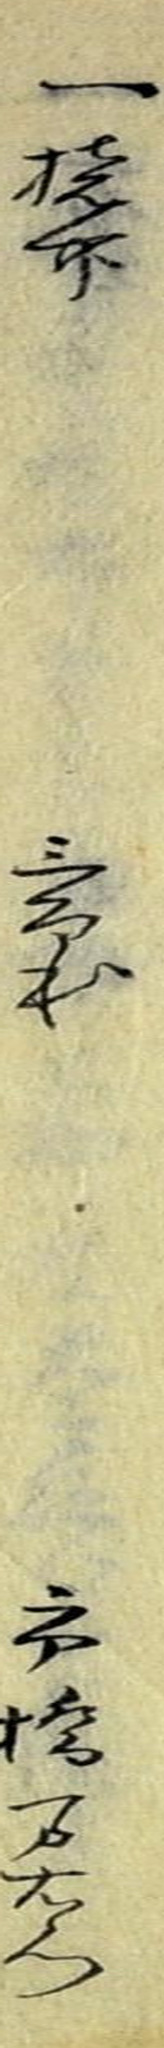一撓竹三百本市橋万右衛門
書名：命令之部 六
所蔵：福井県文書館 Fukui Prefectural Archives
